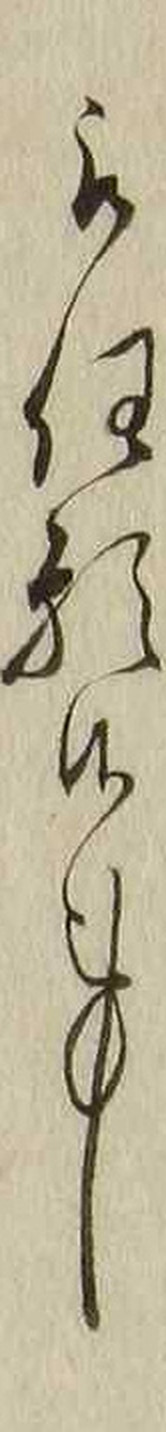被任願候事
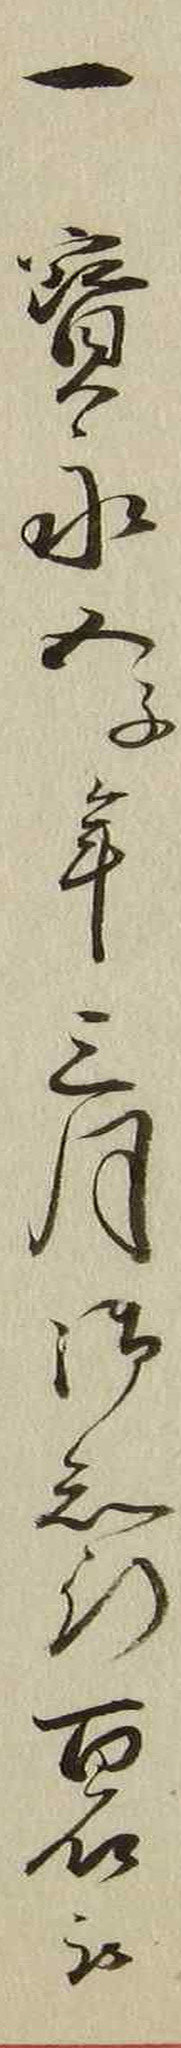一宝永五子年三月御知行百石被
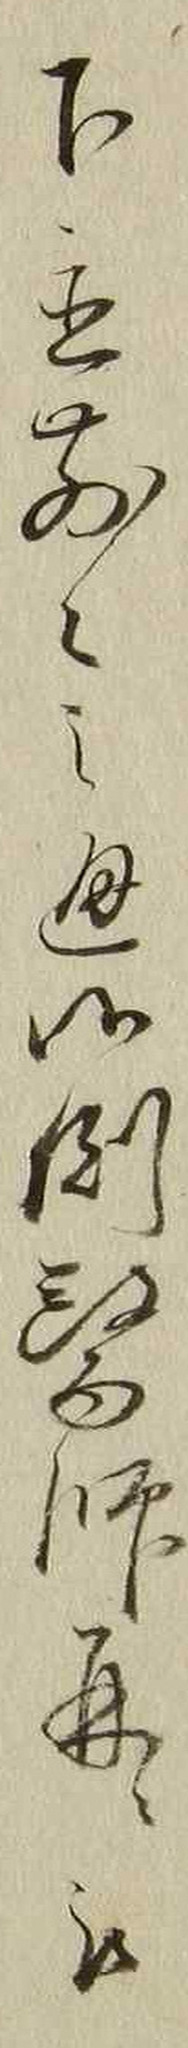下置前々之通御側医師再ニ被
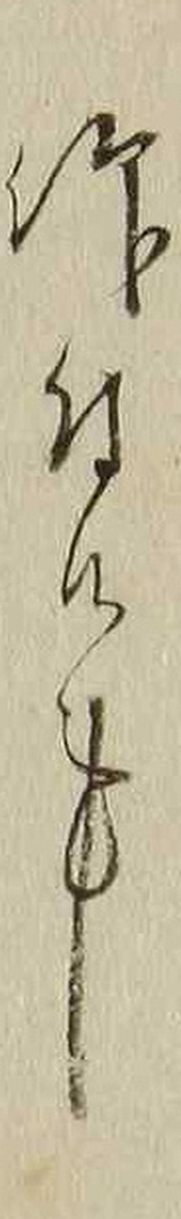仰付候事
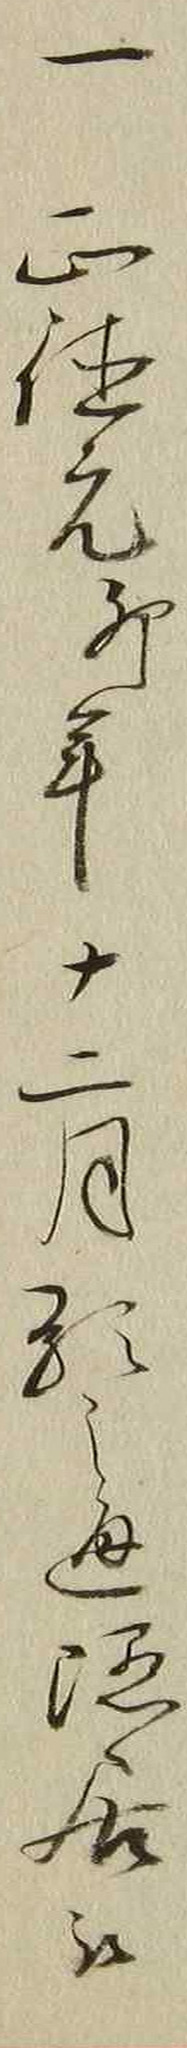一正徳元卯年十二月願之通隠居被
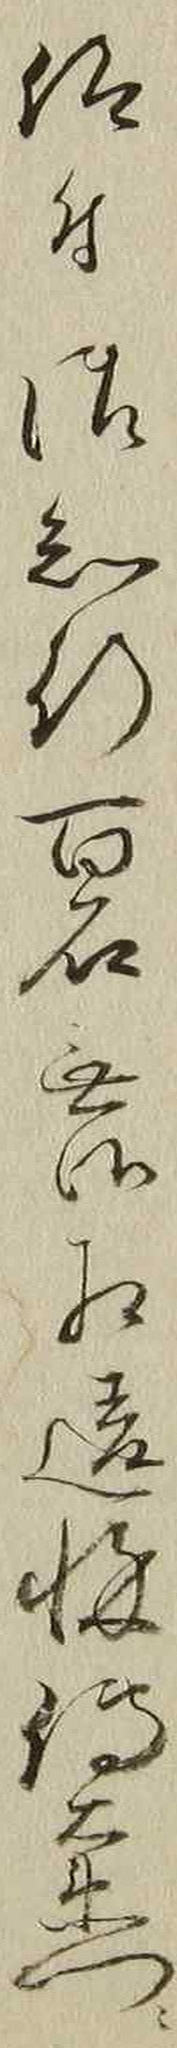仰付御知行百石無御相違忰伝右衛門ニ
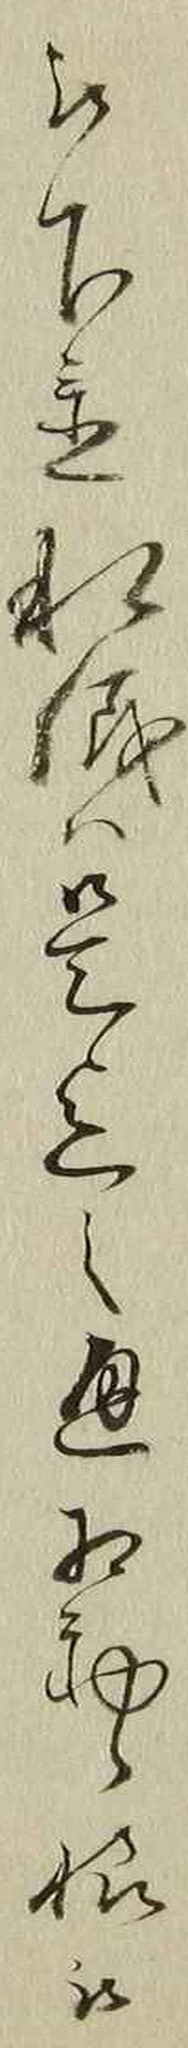被下置私儀ハ是迄之通相勤候様被
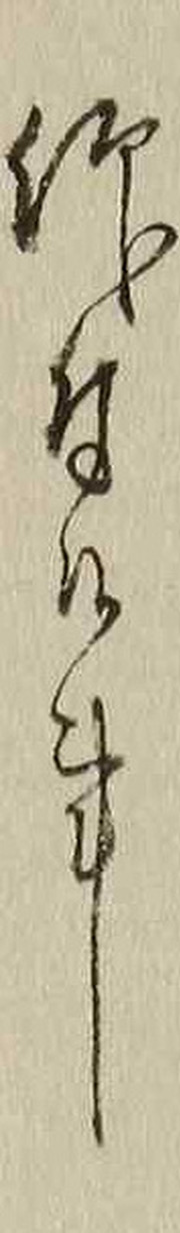仰付候事
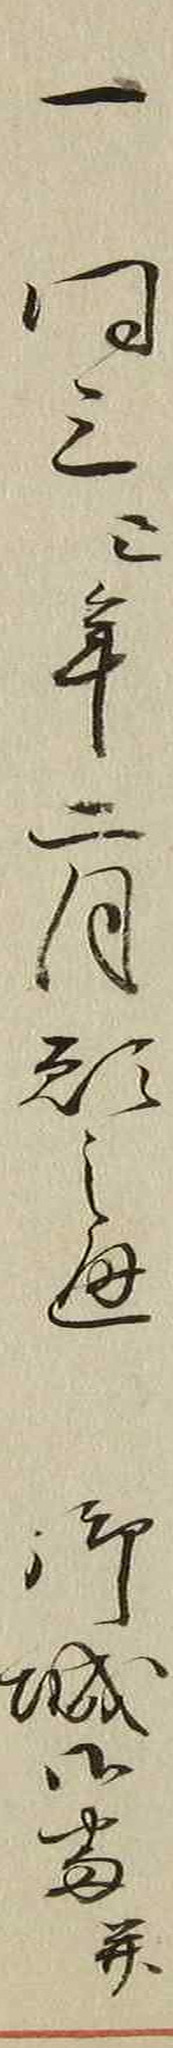一同三巳年二月願之通御城御番并
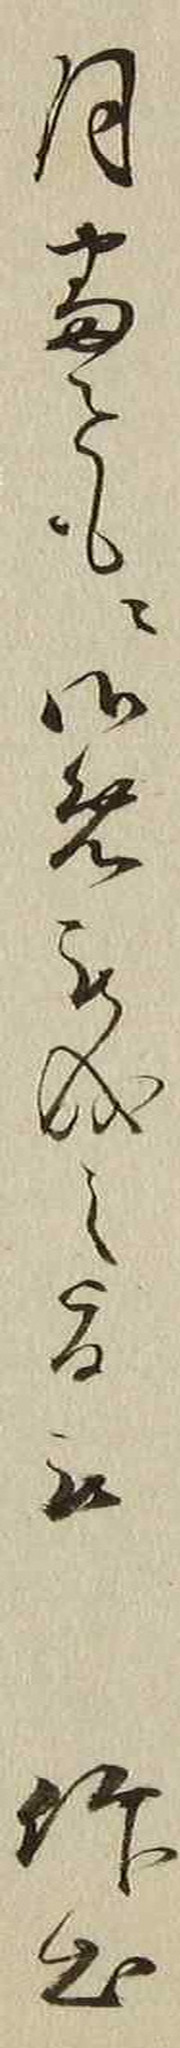月番ともニ御免被成之旨被仰出
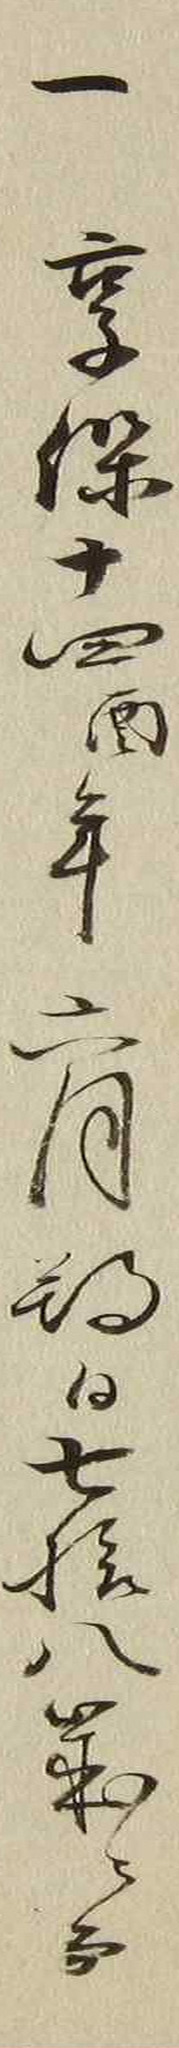一享保十四酉年六月朔日七拾八歳ニ而
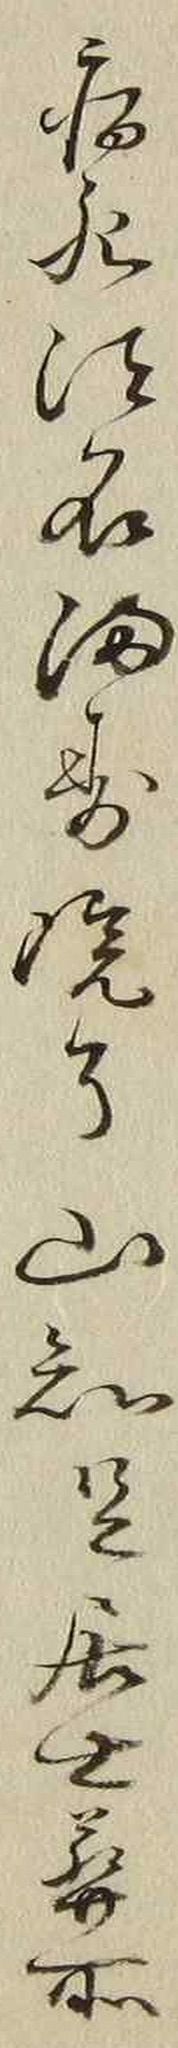病死法名帰壽院了山知足居士葬所
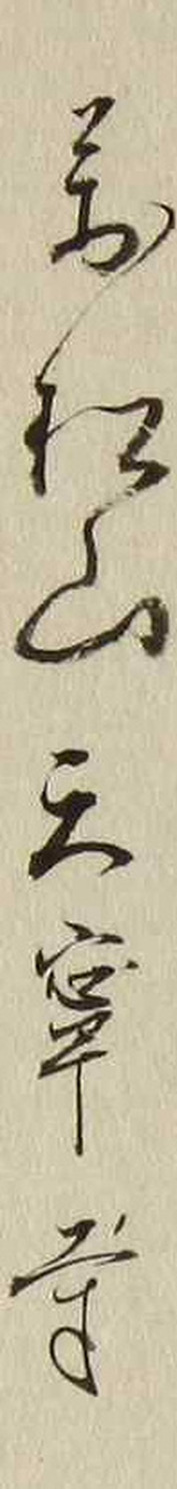萬松山天寧寺

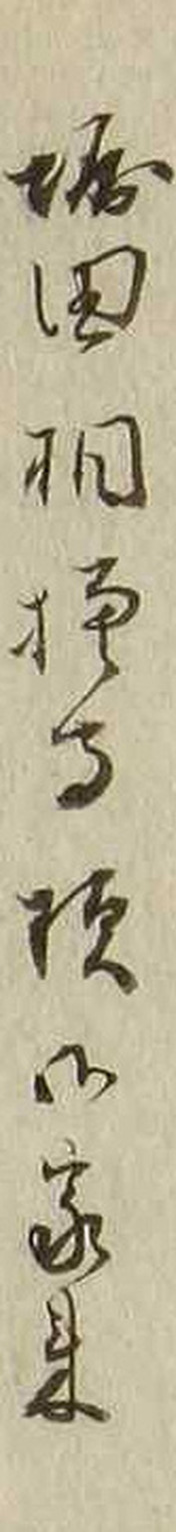堀田相模守様御家来
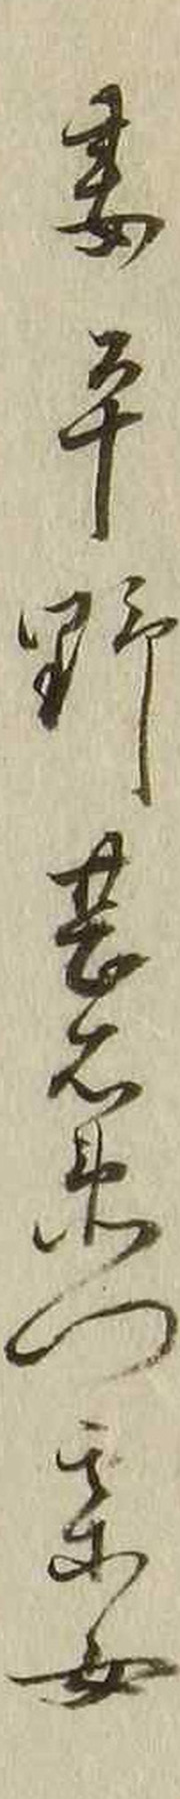妻平野甚右衛門某女
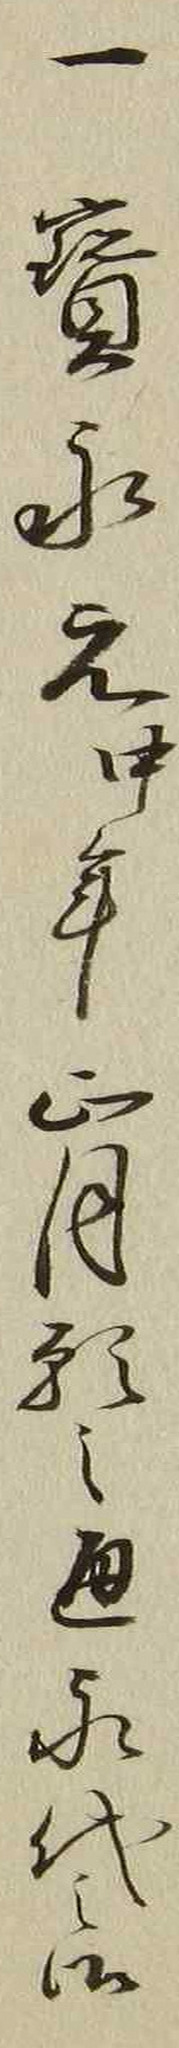一宝永元申年正月願之通永代之御
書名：諸士系譜　巻之26　い之部26
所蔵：会津若松市立会津図書館
